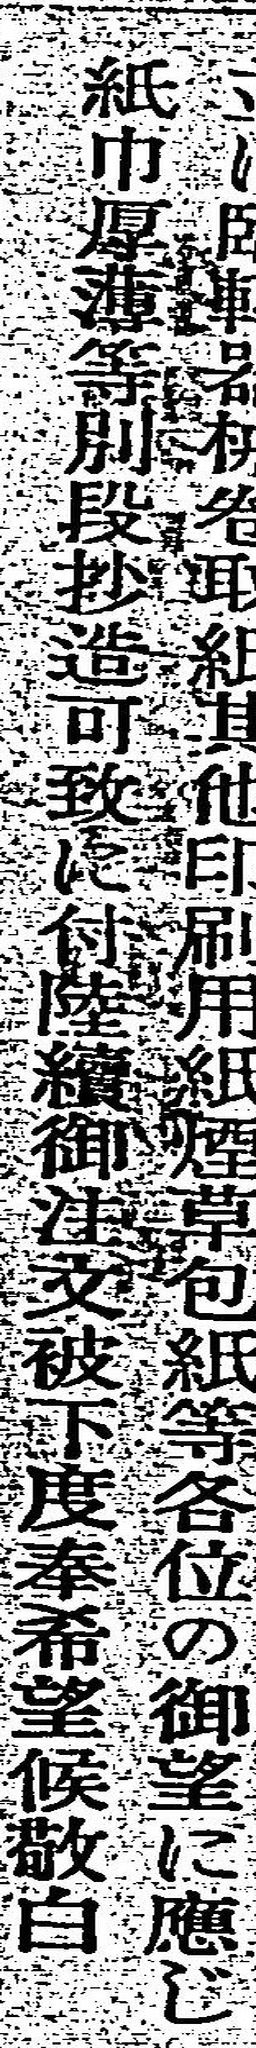紙巾厚薄等別段抄造可致に付陸続御注文被下度奉希望候敬白
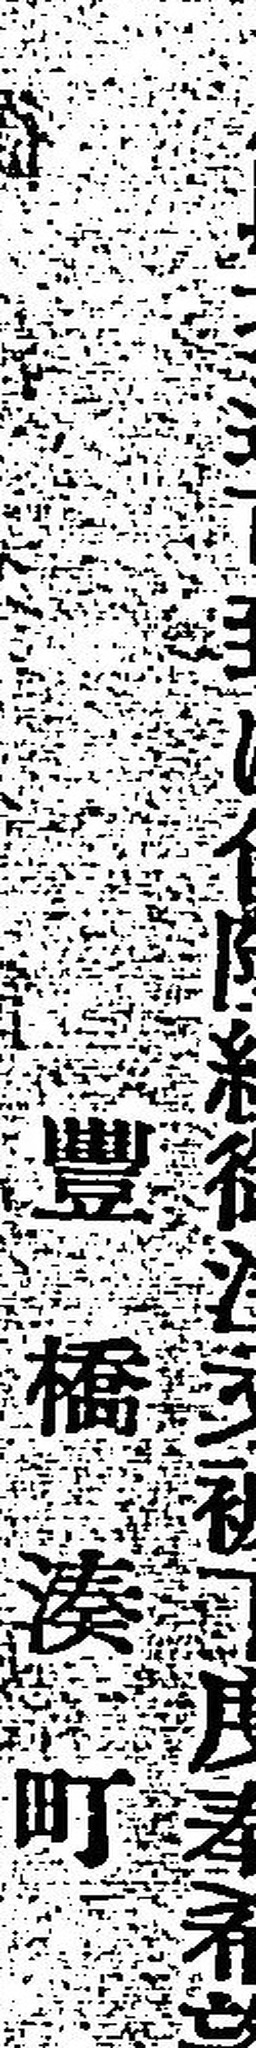豊橋湊町
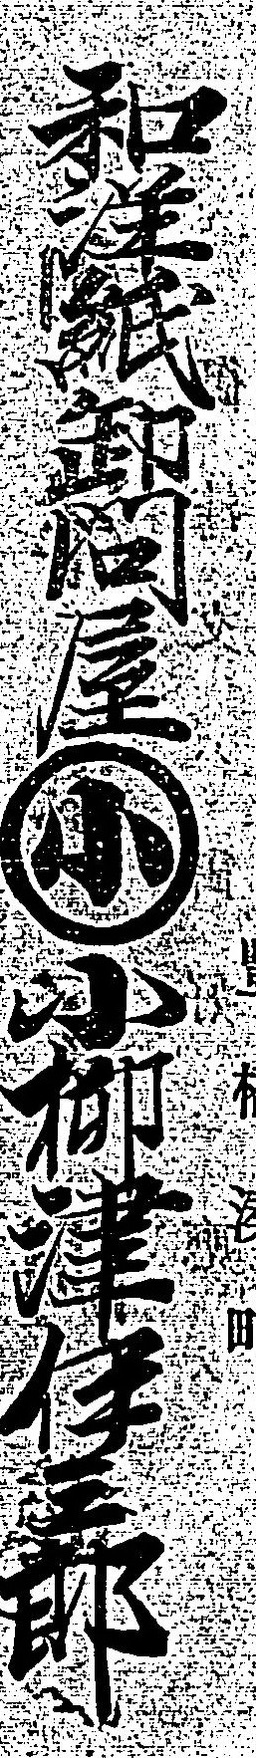和洋紙卸問屋小柳津伊三郎
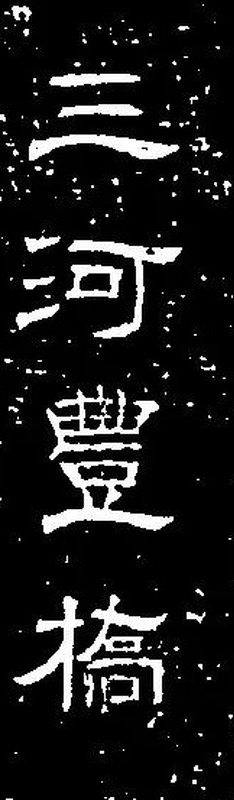三河豊橋
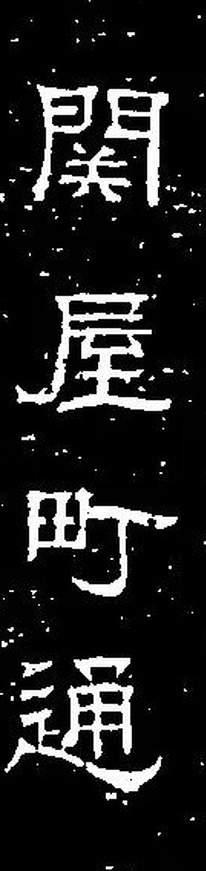関屋町通

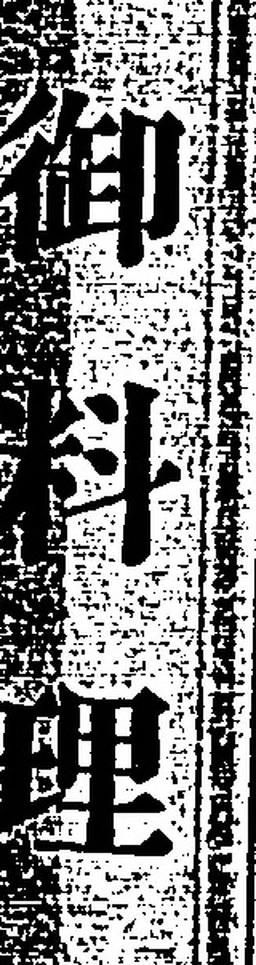御料理
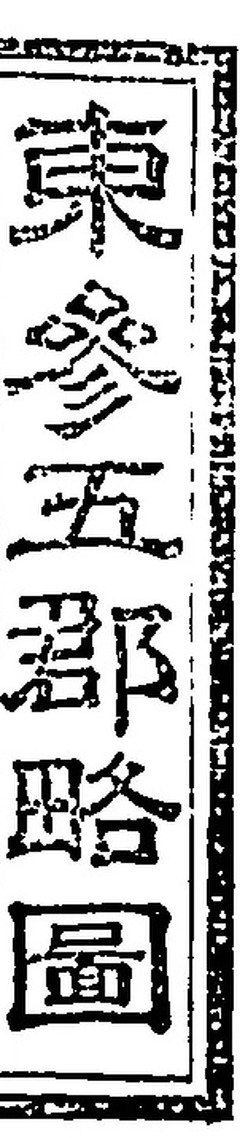東参五郡略図

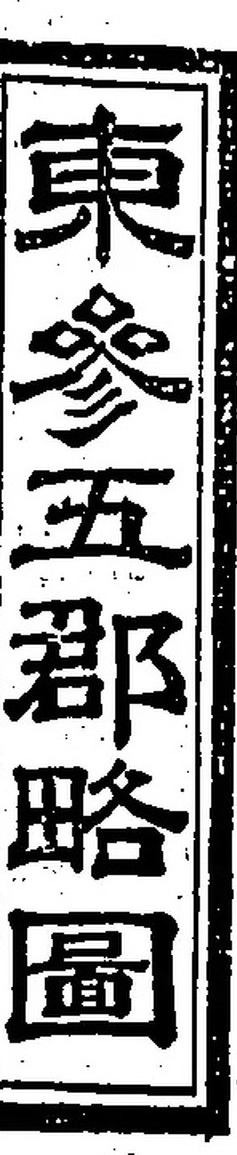東参五郡略図

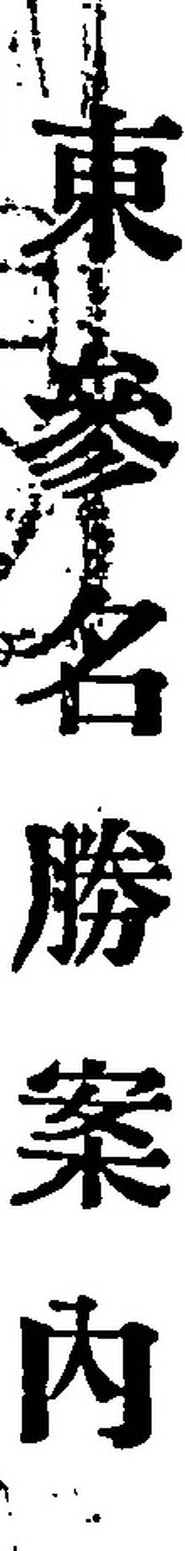東参名勝案内
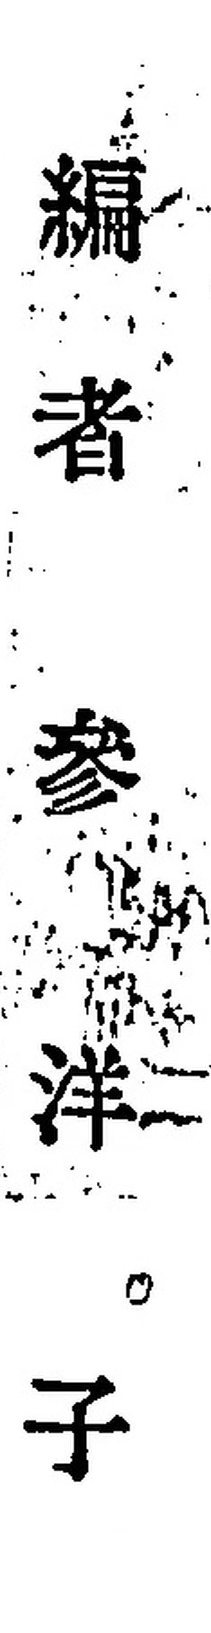編者参洋子
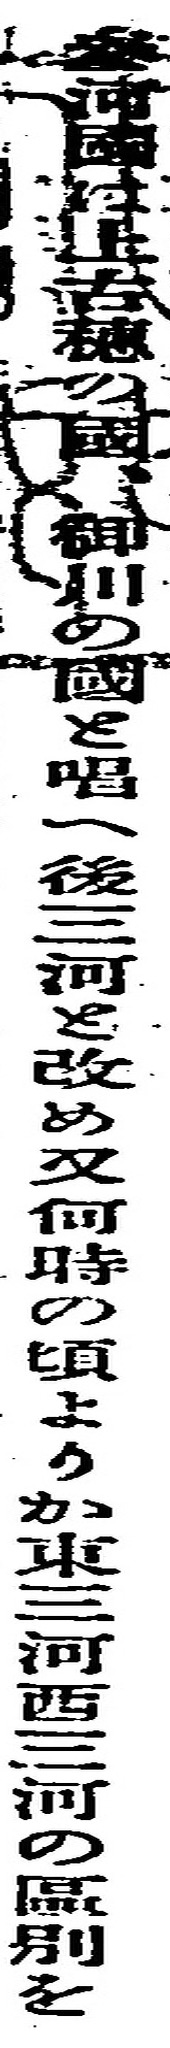参河国は上古穂の国、御川の国と唱へ後三河と改め又何時の頃よりか東三河西三河の区別を
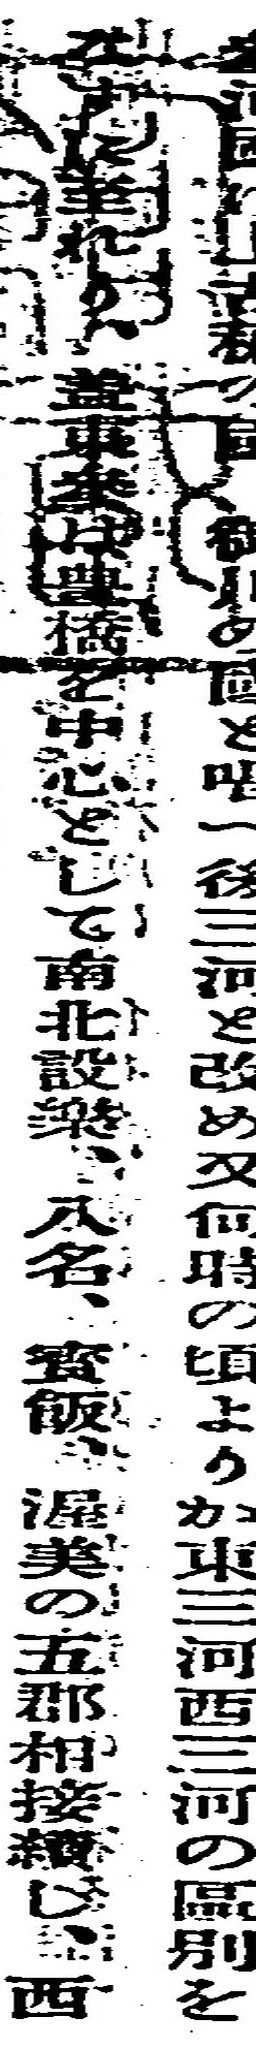なすに至れり、蓋東参は豊橋を中心として南北設楽、八名、宝飯、渥美の五郡相接続し、西
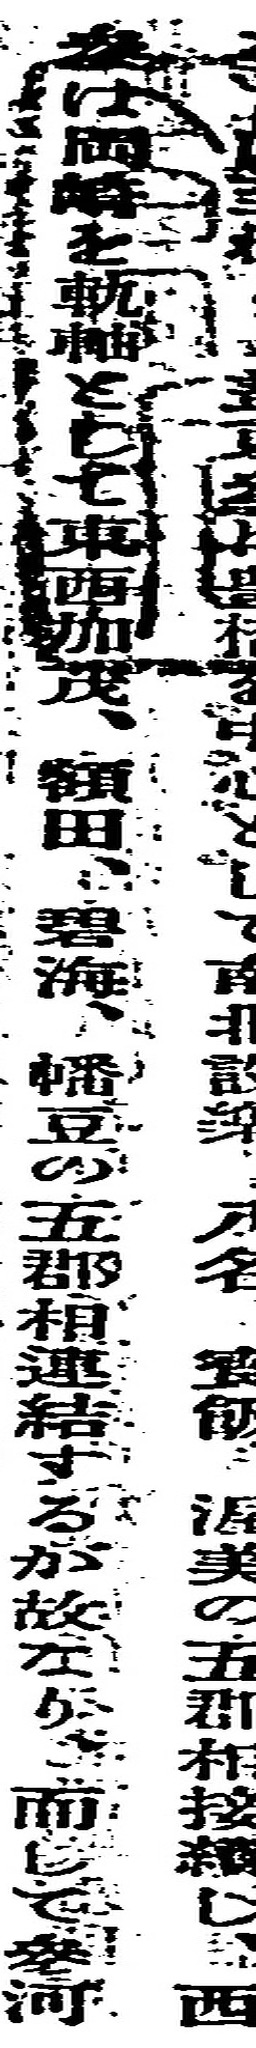参は岡崎を軌軸として東西加茂、額田、碧海、幡豆の五郡相連結するが故なり、而して参河
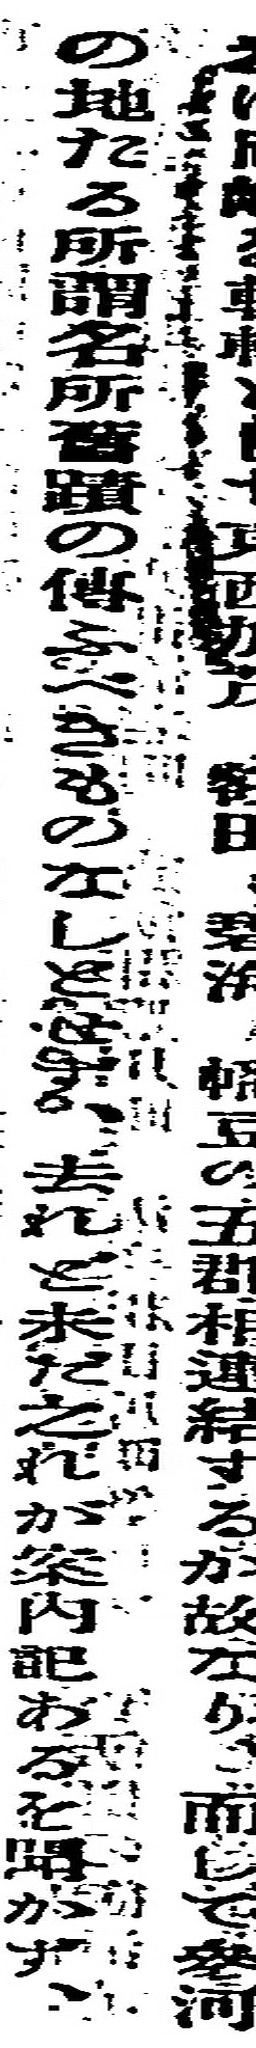の地たる所謂名所旧蹟の伝ふべきものなしとせず、去れど未だ之れが案内記あるを聞かず、
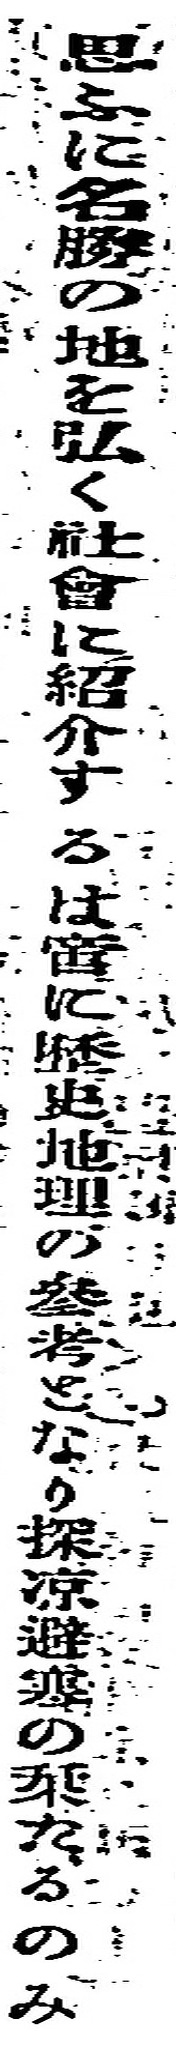思ふに名勝の地を弘く社会に紹介するは啻に歴史地理の参考となり探凉避寒の栞たるのみ
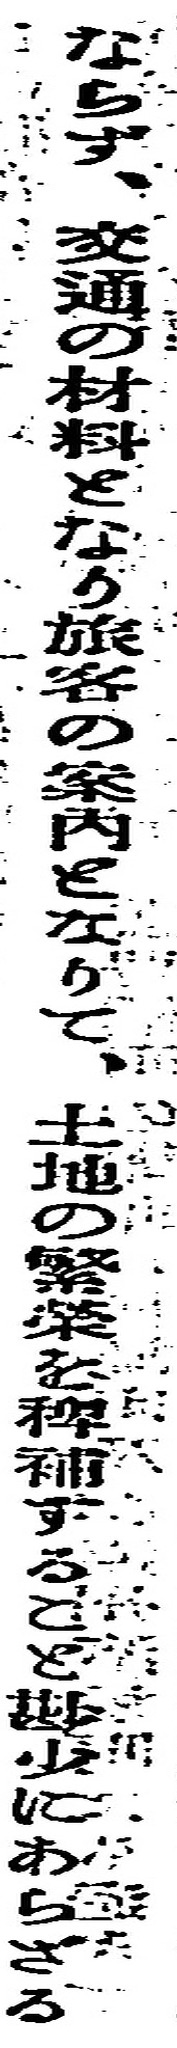ならず、交通の材料となり旅客の案内となりて、土地の繁栄を稗補すること尠少にあらざる
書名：東参名勝案内
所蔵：国立国会図書館 National Diet Library, JAPAN
